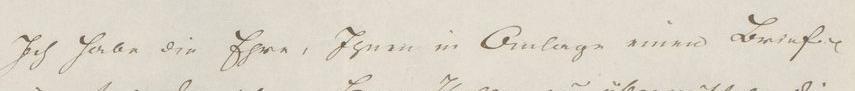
Ich habe die Ehre, Ihnen in Anlage einen Brief &
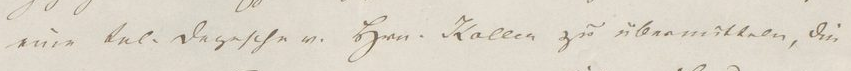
eine tel. Depesche v. Hrn. Koller zu übermitteln, die
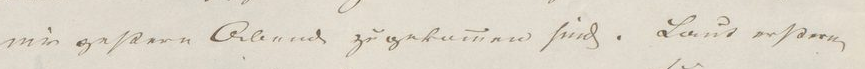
mir gestern Abend zugekommen sind. Laut ersterm
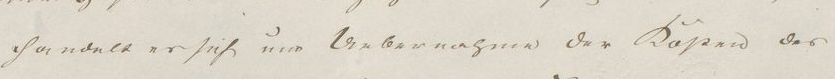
handelt es sich um Uebernahme der Kosten des
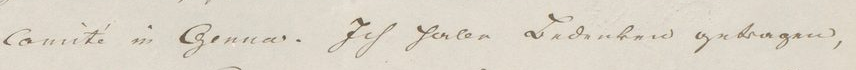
Comité in Genua. Ich habe Bedenken getragen,
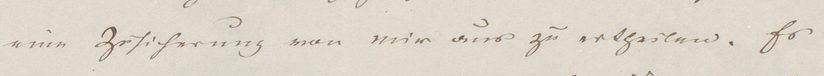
eine Zusicherung von mir aus zu ertheilen. Es
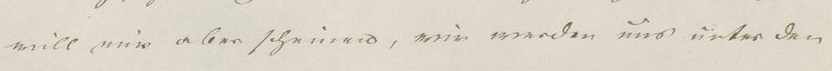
will mir aber scheinen, wir werden uns unter den
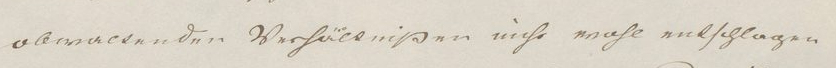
obwaltenden Verhältnißen nicht wohl entschlagen
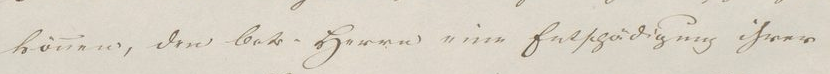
können, den betr. Herrn eine Entschädigung ihrer
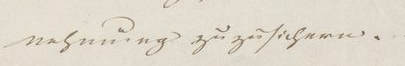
nehmung zuzusichern. –
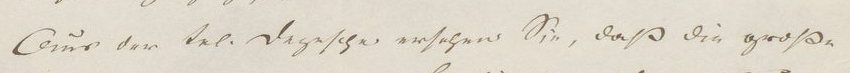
Aus der tel. Depesche ersehen Sie, daß die große
